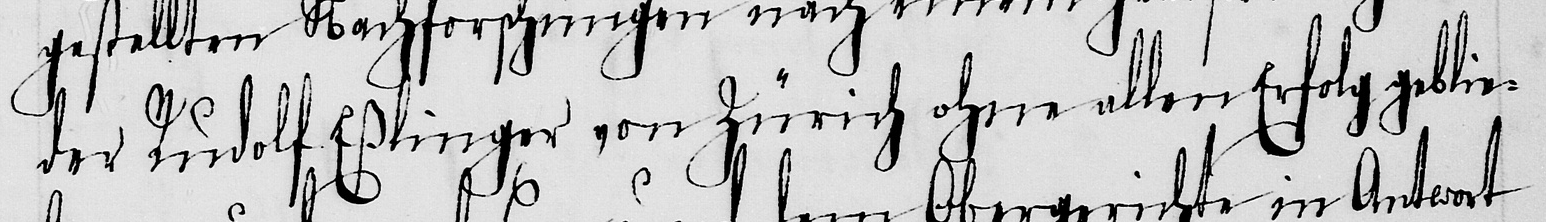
der Rudolf Eßlinger von Zürich ohne allen Erfolg geblie¬
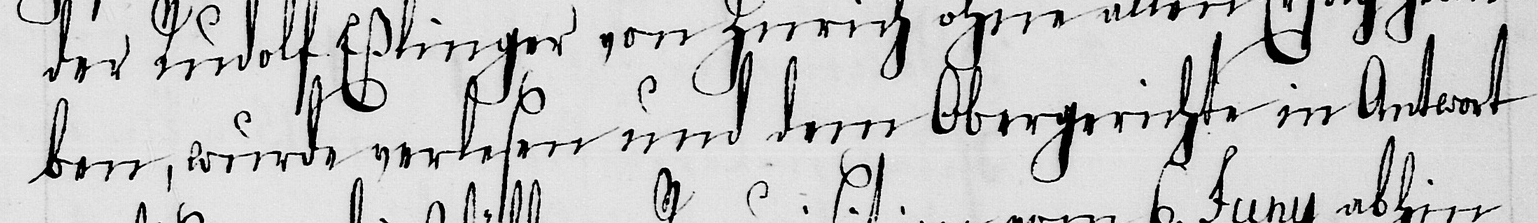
ben, wurde verlesen und dem Obergerichte in Antwort
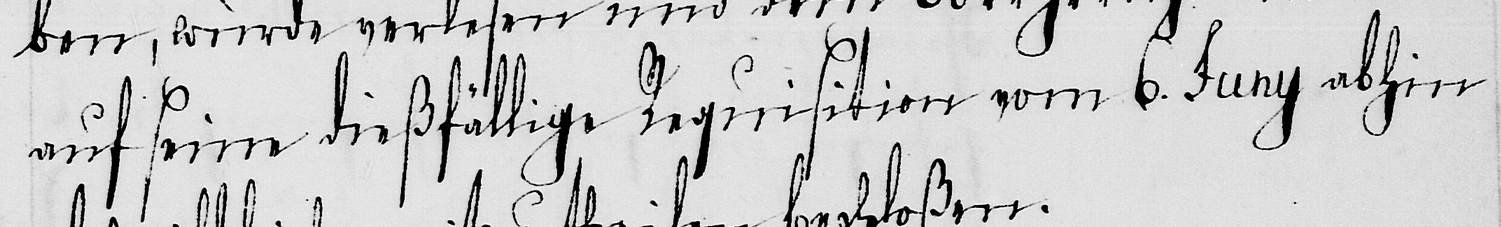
auf seine dießfällige Requisition vom 6. Juny abhin
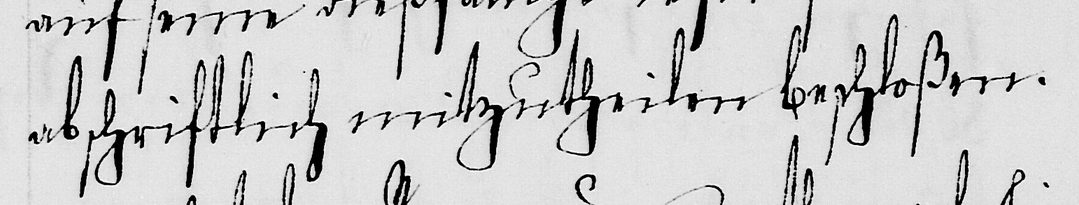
abschriftlich mitzutheilen beschloßen.
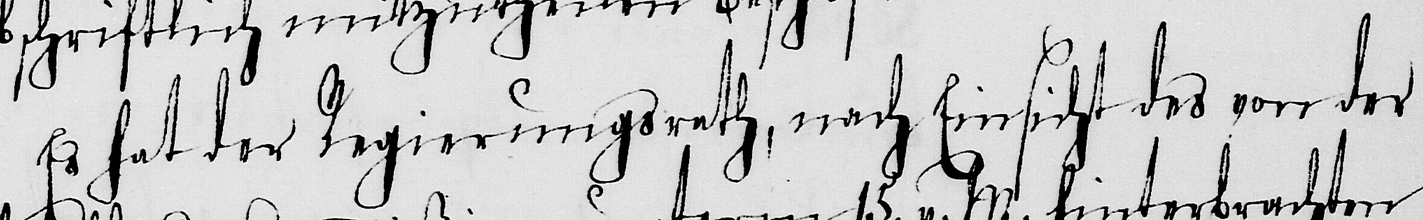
Es hat der Regierungsrath, nach Einsicht des von der
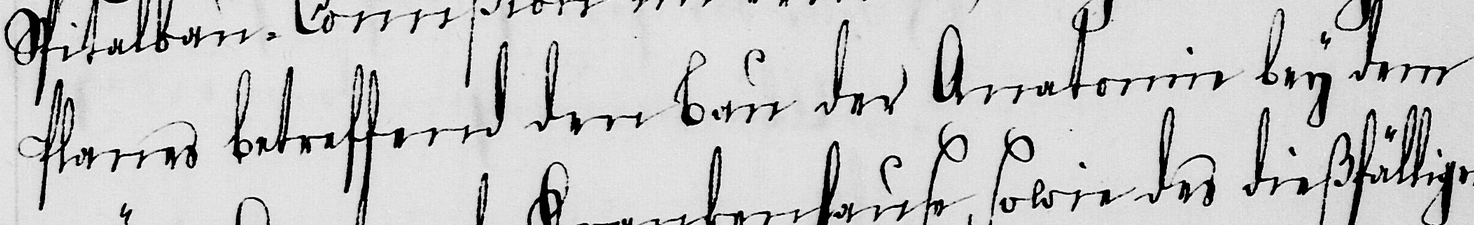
Planes betreffend den Bau der Anatomie bey dem
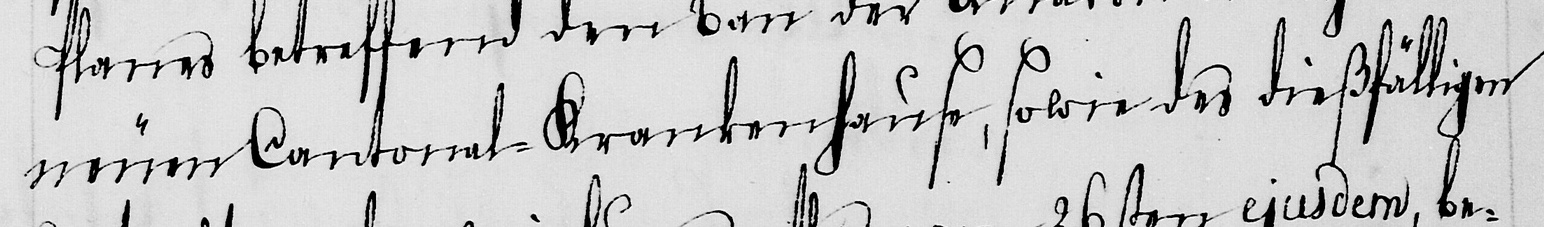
neuen Cantonal-Krankenhause, sowie des dießfälligen
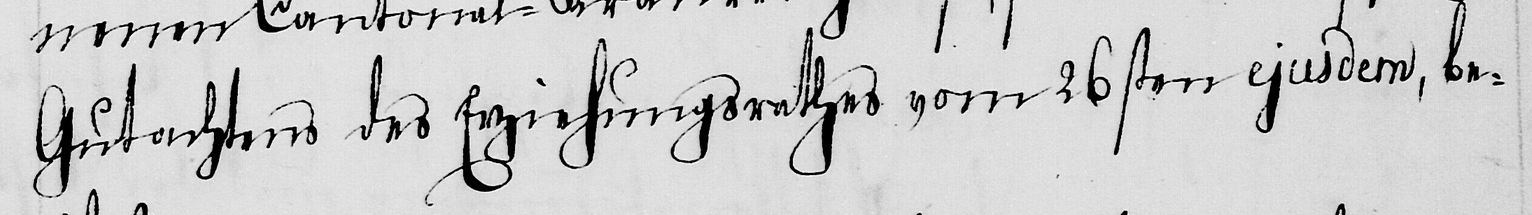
Gutachtens des Erziehungsrathes vom 26sten ejusdem, bes¬
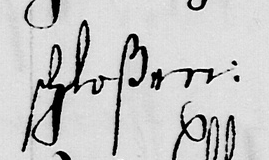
chloßen:
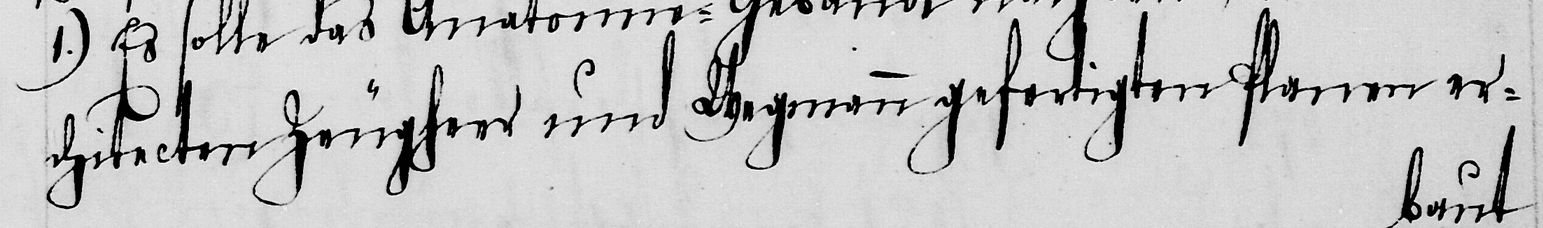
chitecten Zeugherr und Wegmann gefertigten Planen er-
